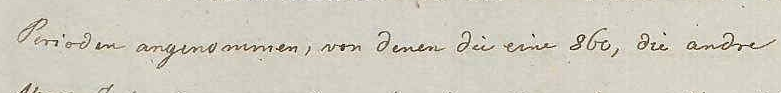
Perioden angenommen, von denen die eine 860, die andre
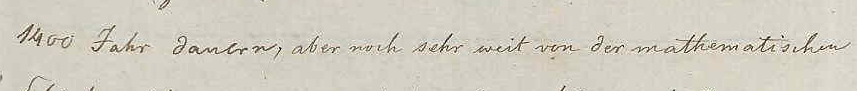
1400 Jahr dauern, aber noch sehr weit von der mathematischen
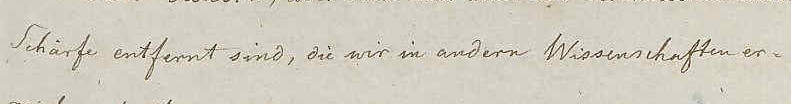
Schärfe entfernt sind, die wir in andern Wissenschaften er-
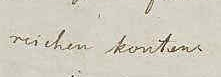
reichen konten.
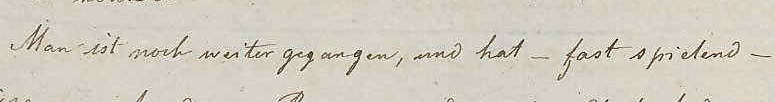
Man ist noch weiter gegangen, und hat – fast spielend –
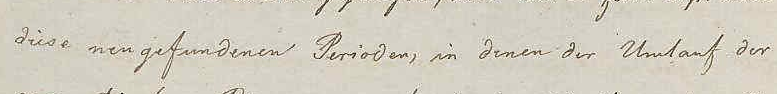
diese neu gefundenen Perioden, in denen der Umlauf der
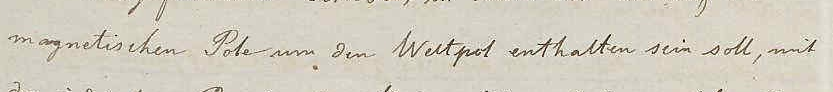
magnetischen Pole um den Weltpol enthalten sein soll, mit
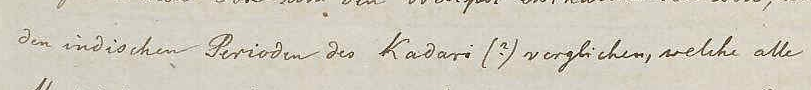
den indischen Perioden des Kadari verglichen, welche alle
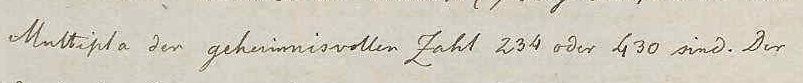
Multipla der geheimnisvollen Zahl 234 oder 430 sind. Der
